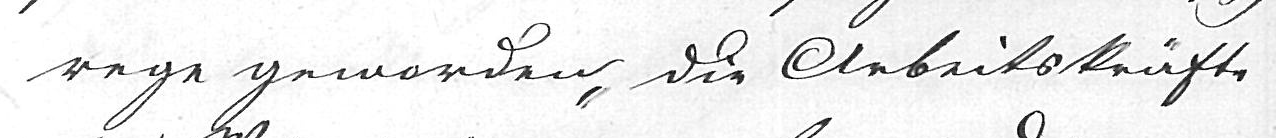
rege geworden, die Arbeitskräfte
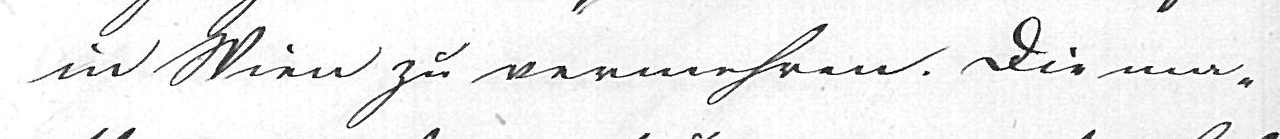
in Wien zu vermehren. Die ma-
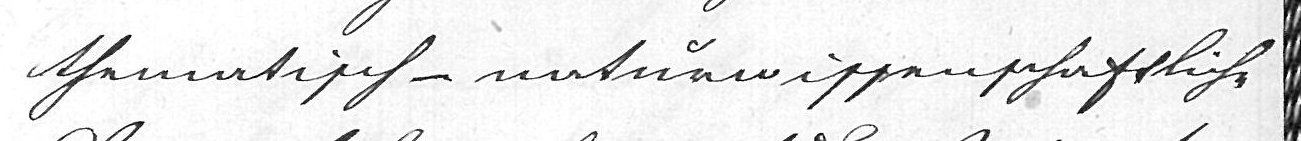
thematisch-naturwissenschaftliche
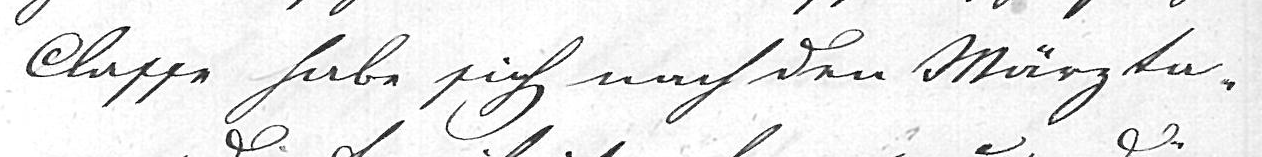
Classe habe sich nach den Märzta-
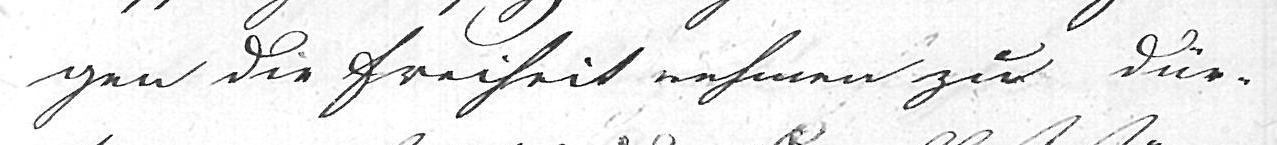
gen die Freiheit nehmen zu dü-
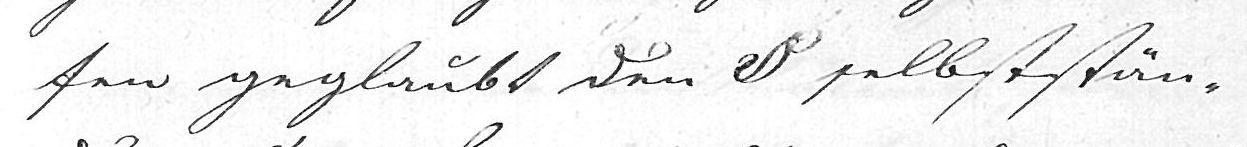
fen geglaubt den § selbststän-
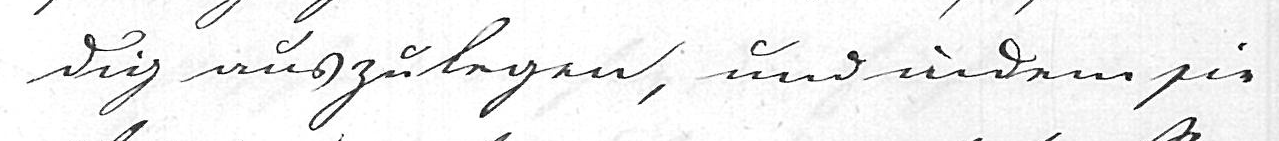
dig auszulegen, und indem sie
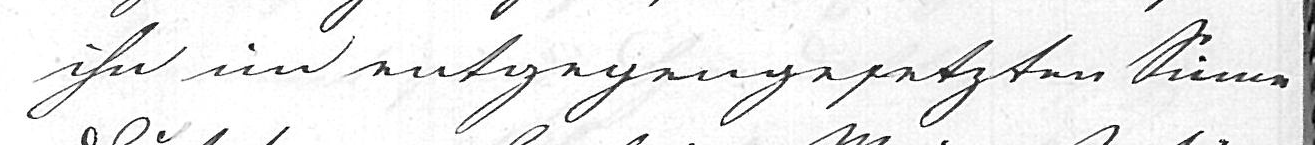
ihn im entgegengesetzten Sinne
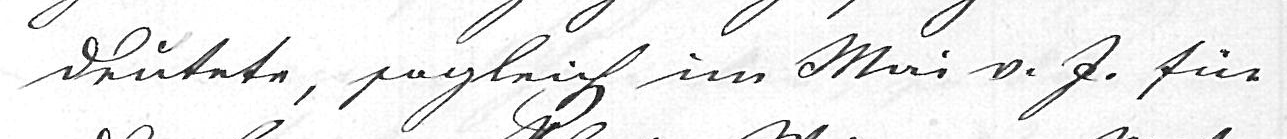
deutete, sogleich im Mai v. J. für
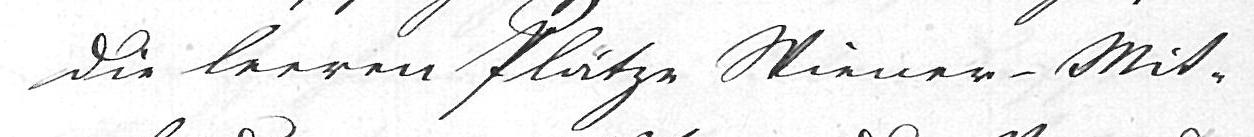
die leeren Plätze Wiener-Mit-
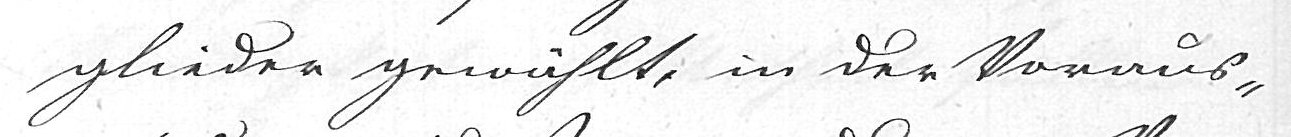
glieder gewählt, in der Voraus-
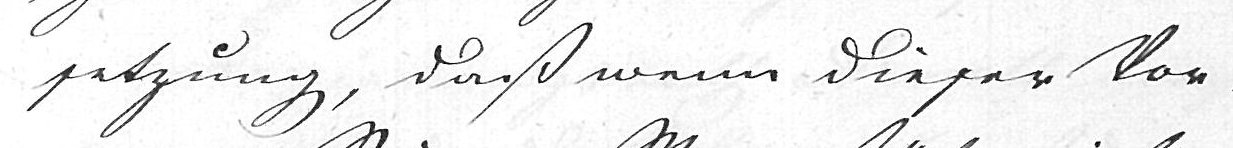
setzung, daß wenn dieser Vor-
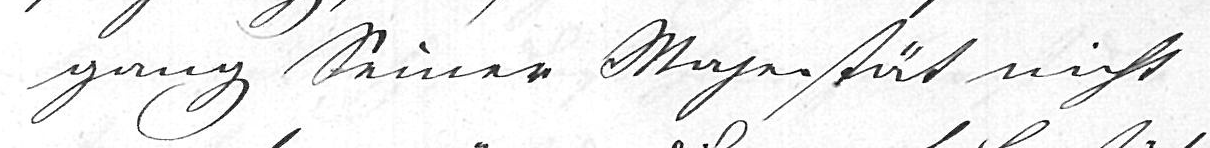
gang Seiner Majestät nicht
